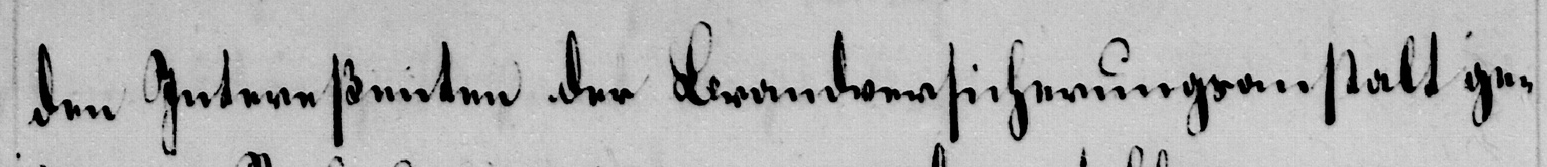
den Intereßenten der Brandversicherungsanstalt ge¬
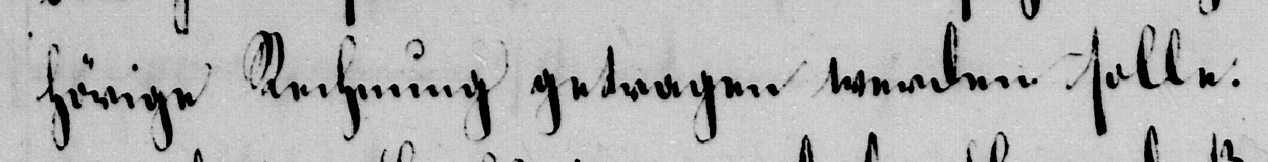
hörige Rechnung getragen werden solle.
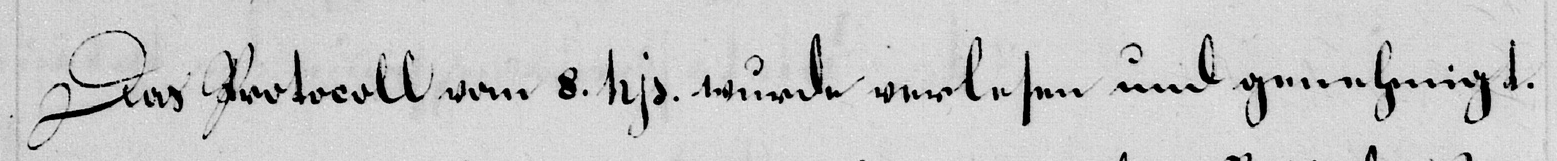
Das Protocoll vom 8. hjs. wurde verlesen und genehmigt.
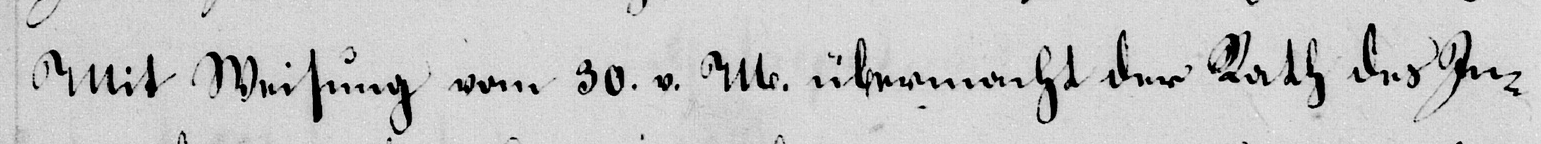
Mit Weisung vom 30. v. M. übermacht der Rath des In¬
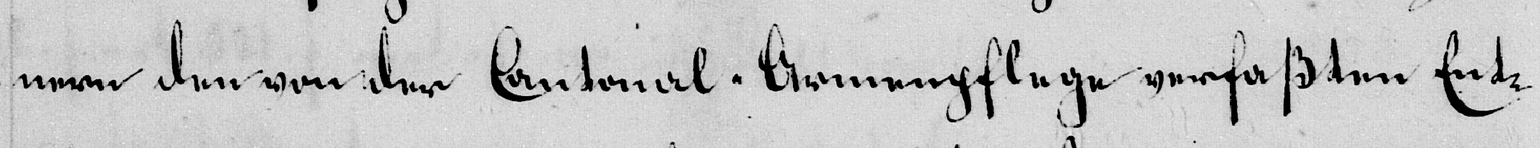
nern den von der Cantonal-Armenpflege verfaßten Ent¬
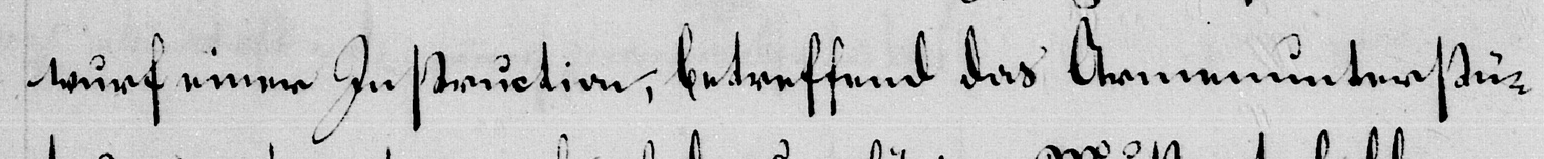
wurf einer Instruction, betreffend das Armenunterstü¬
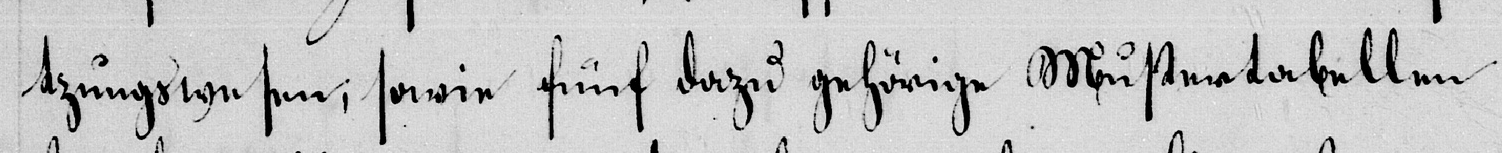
tzungswesen, sowie fünf dazu gehörige Mustertabellen
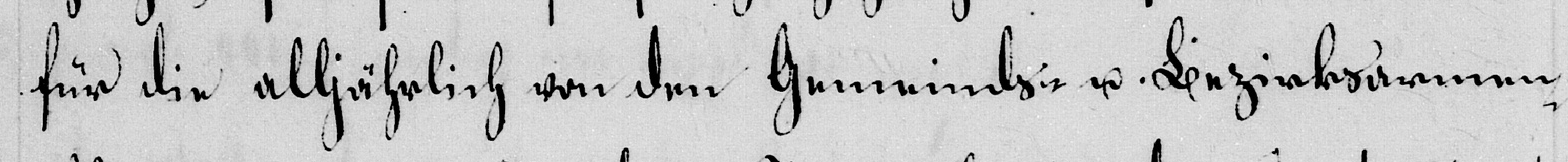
für die alljährlich von den Gemeinds- u. Bezirksarmen¬
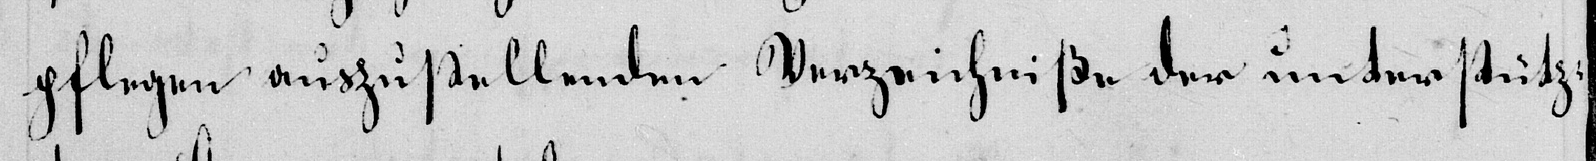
pflegen auszustellenden Verzeichniße der unterstütz¬
